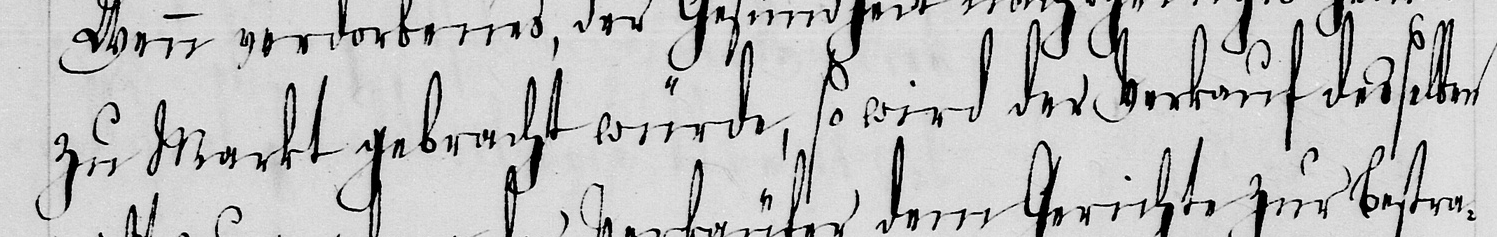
zu Markte gebracht würde, so wird der Verkauf desselben
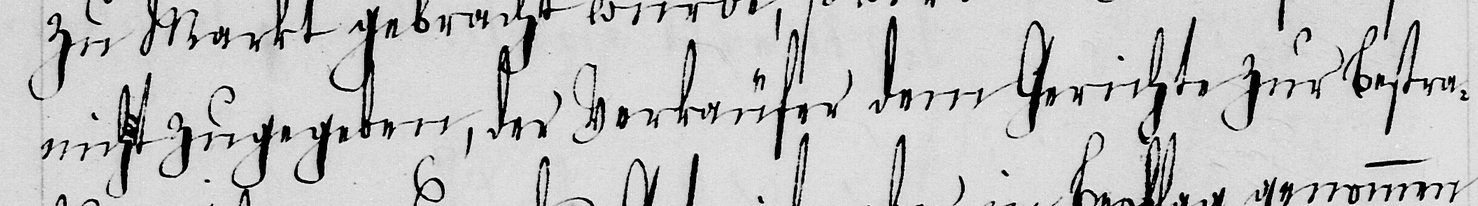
nicht zugegeben, der Verkäufer dem Gerichte zur Bestra¬
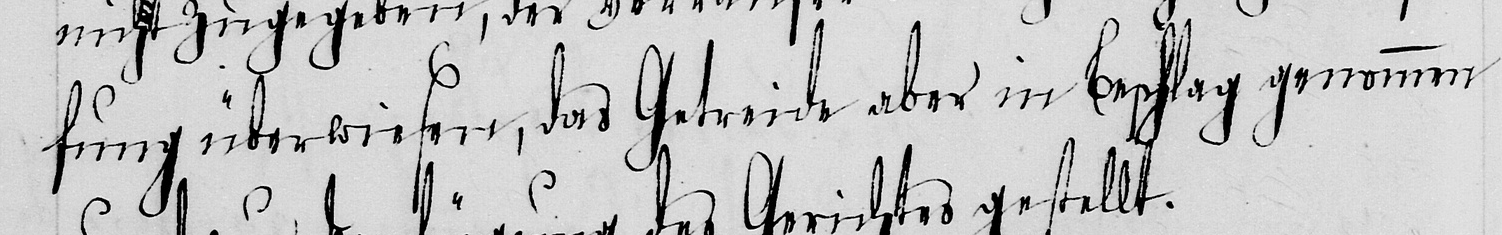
fung überwiesen, das Getreide aber in Beschlag genommen
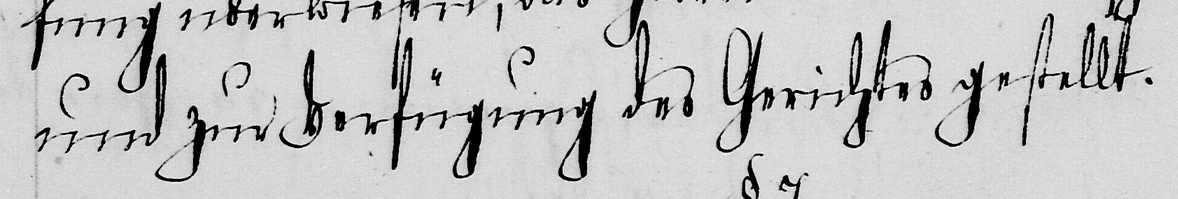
und zur Verfügung des Gerichtes gestellt.
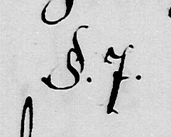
§. 7.
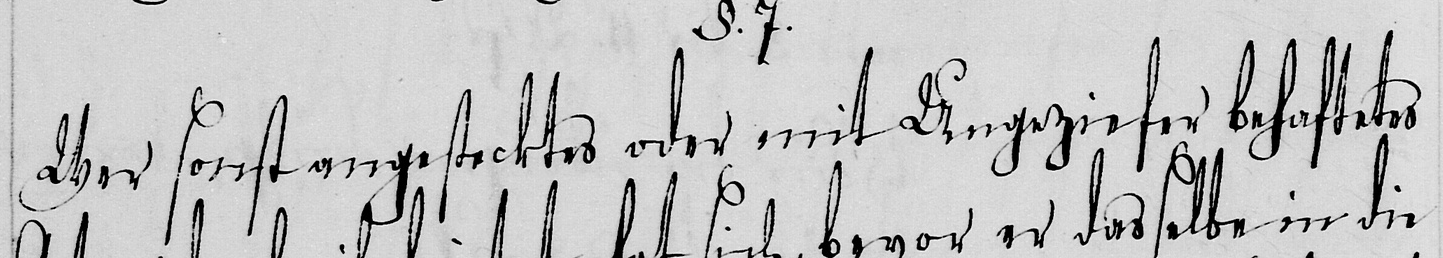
Wer sonst angestecktes oder mit Ungeziefer behaftetes
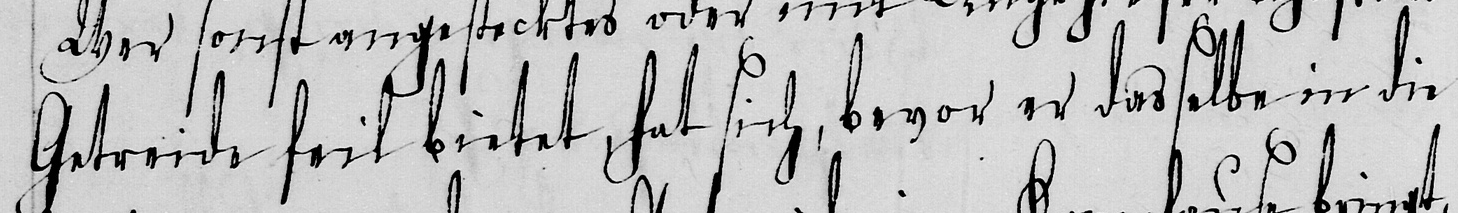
Getreide feil bietet, hat sich, bevor er dasselbe in
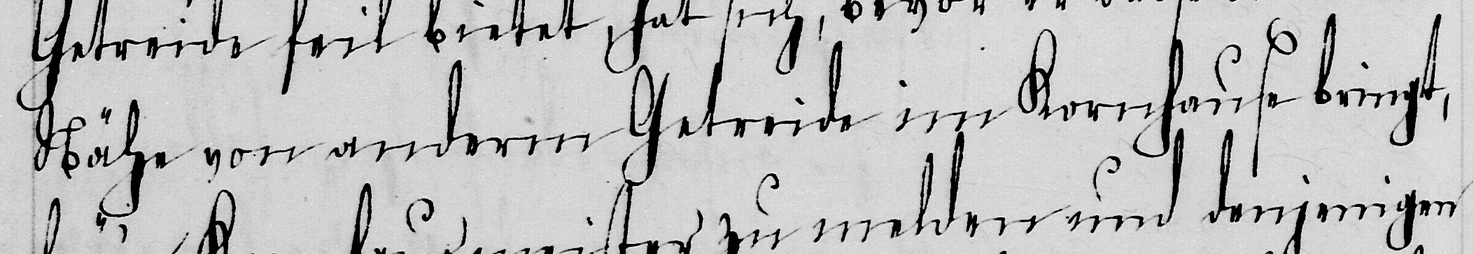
Nähe von anderm Getreide im Kornhause bringt,
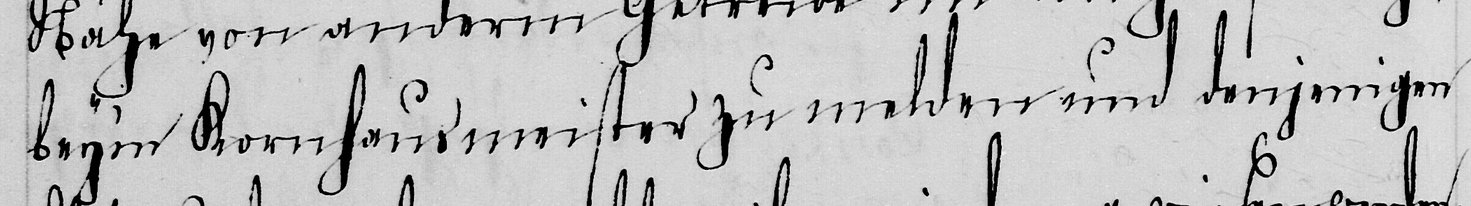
bey’m Kornhausmeister zu melden und denjenigen
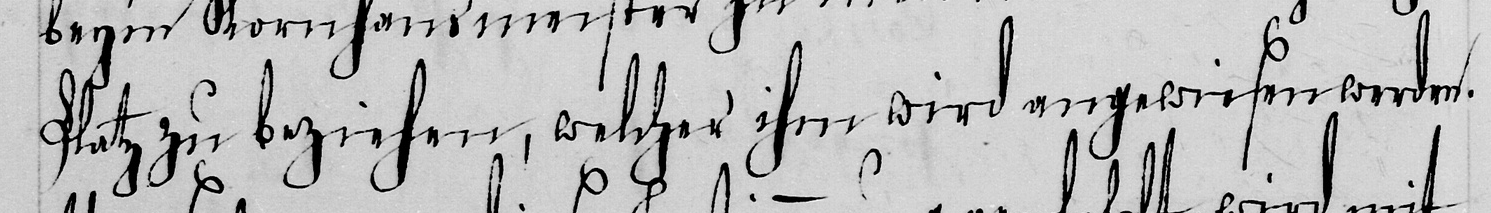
Platz zu beziehen, welcher ihm wird angewiesewn werden.
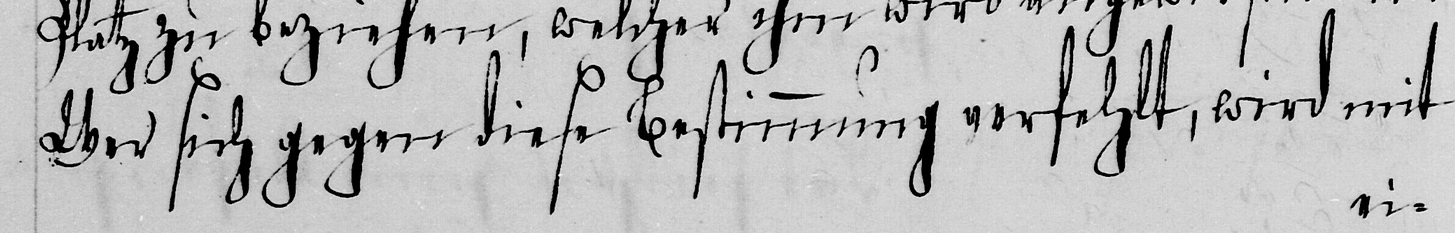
Wer sich gegen diese Bestimmung verfehlt, wird mit
